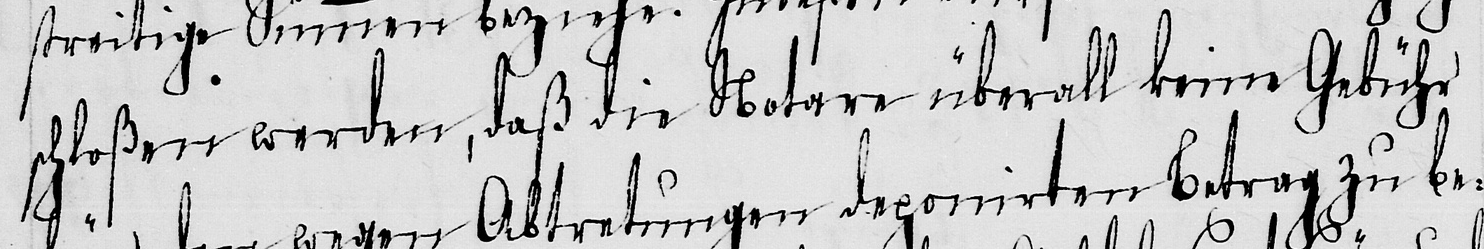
schloßen werden, daß die Notare überall keine Gebühr
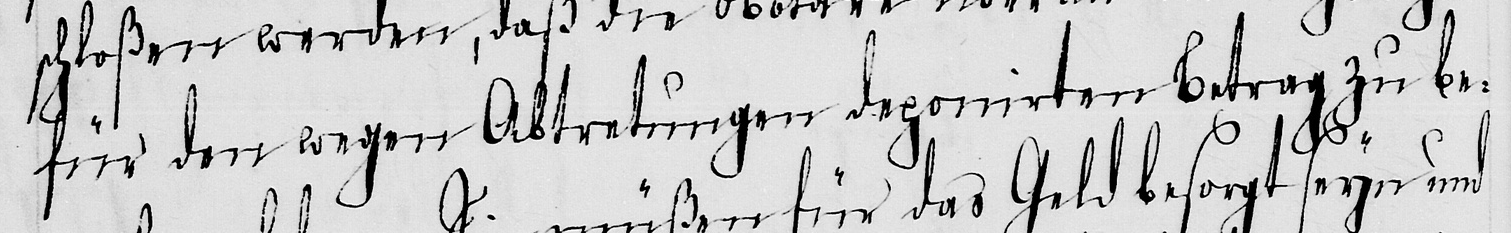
für den wegen Abtretungen deponirten Betrag zu be¬
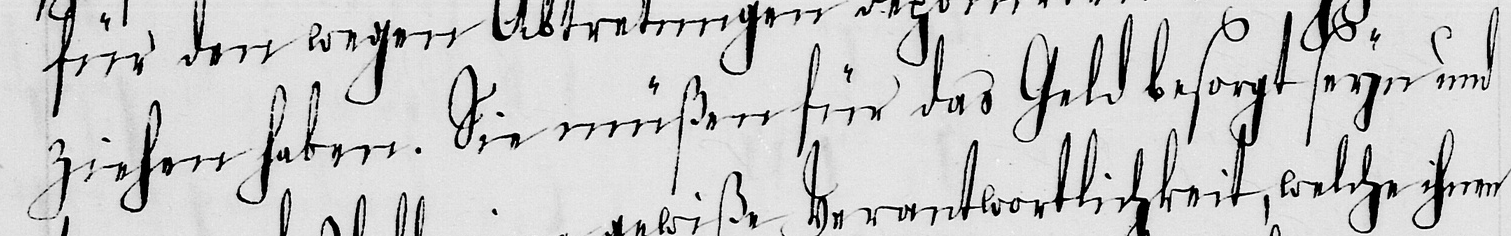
ziehen haben. Sie müßen für das Geld besorgt seyn und
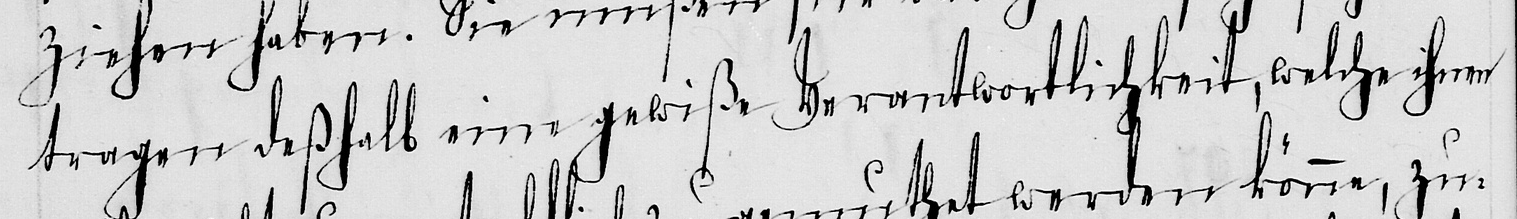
tragen deßhalb eine gewiße Verantwortlichkeit, welche ihnen
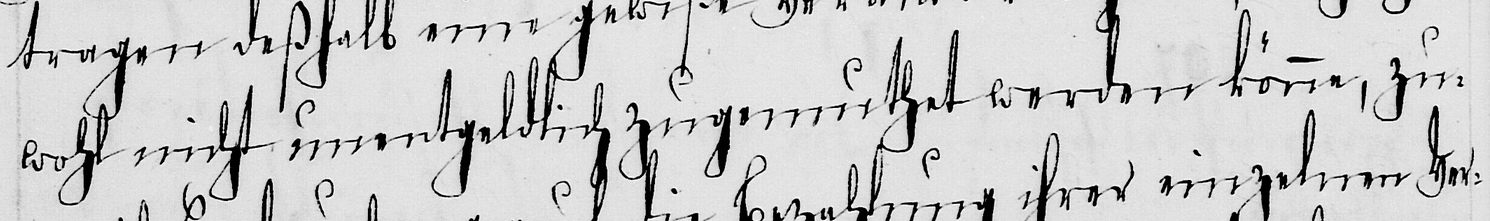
wohl nicht unentgeldlich zugemuthet werden könne, zu¬
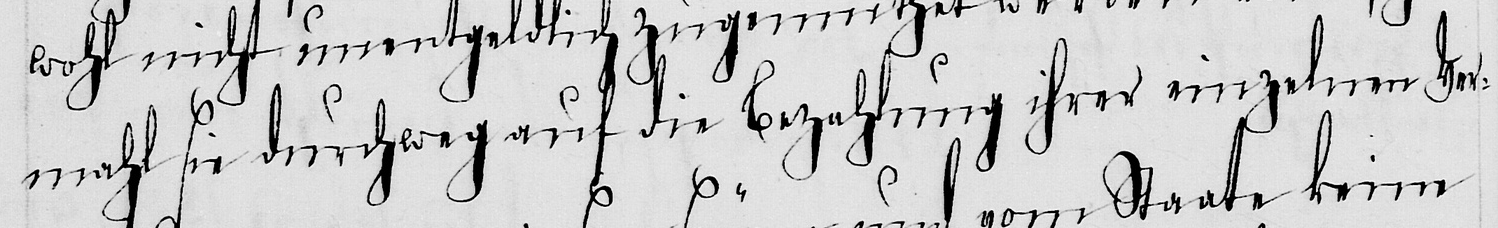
mahl sie durchweg auf die Bezahlung ihrer einzelnen Ver¬
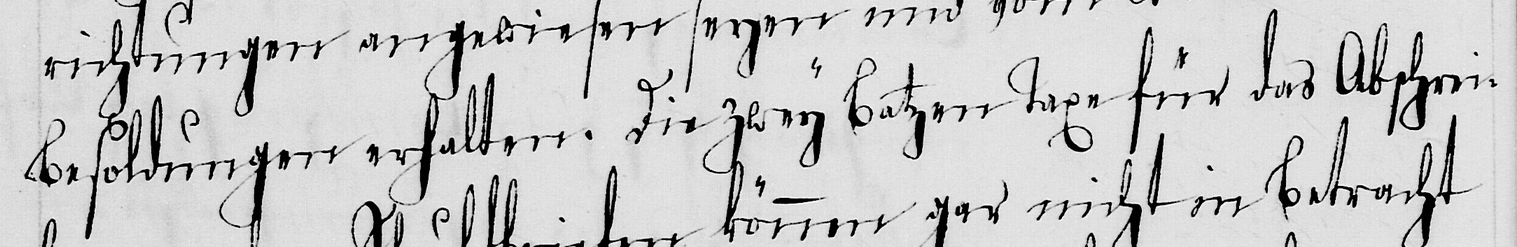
Besoldungen erhalten. Die zwey Batzen Taxe für das Abschre¬
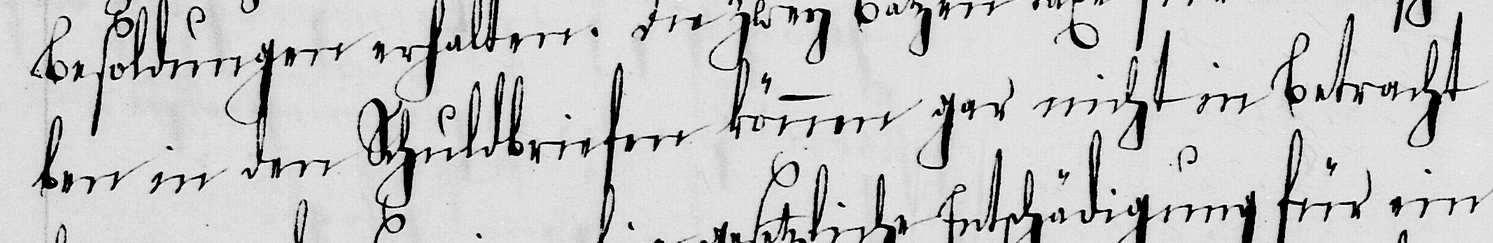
iben in den Schuldbriefen können gar nicht in Betracht
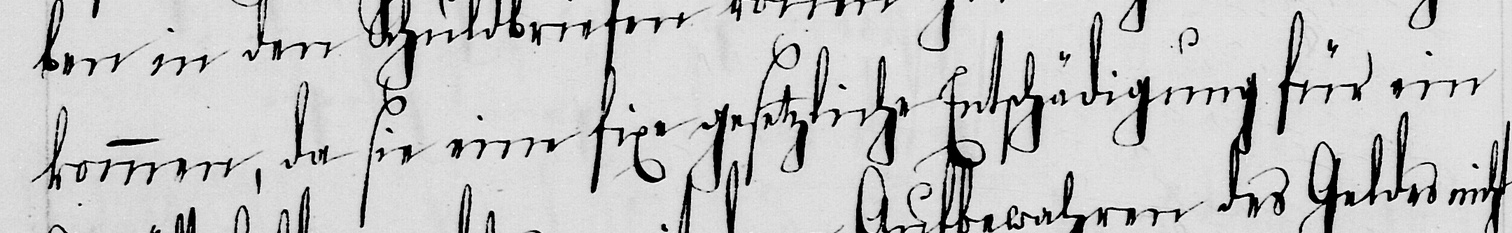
kommen, da sie eine fixe gesetzliche Entschädigung für ein
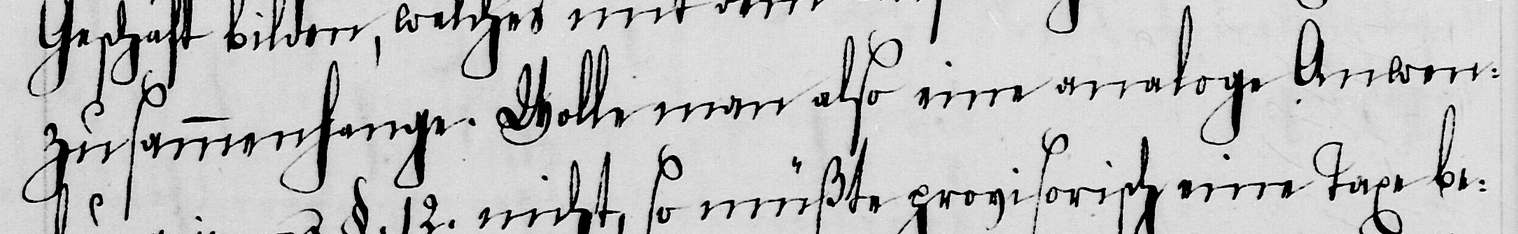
zusammenhange. Wolle man also eine analoge Anwen¬
